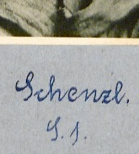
Schenzl.
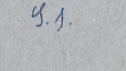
S. 1.
